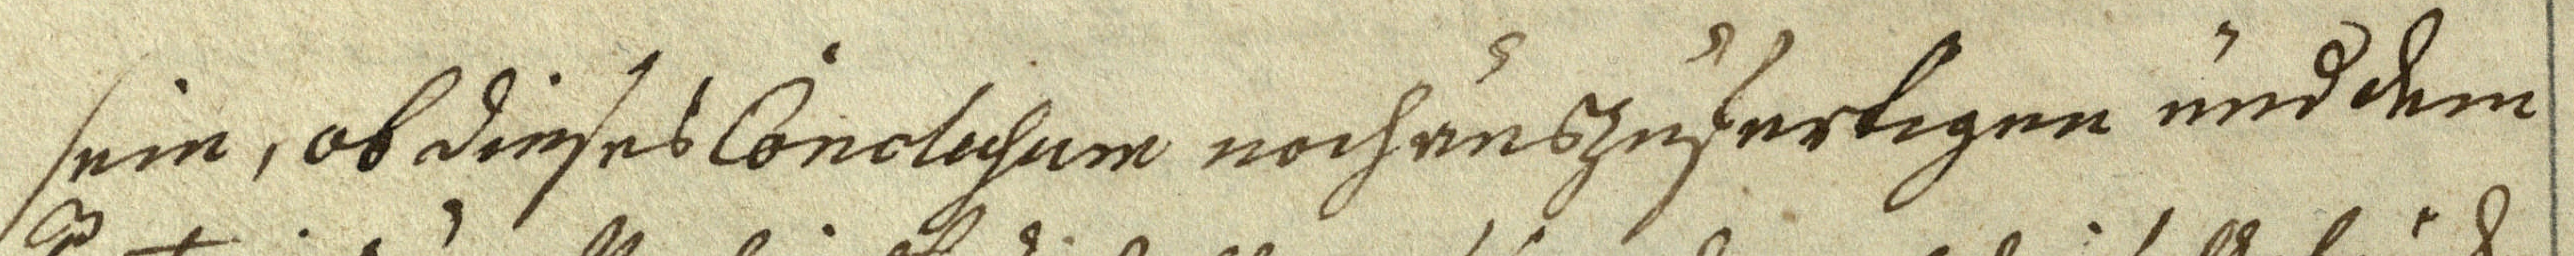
sein, ob diese Conclusum noch auszufertigen und dem
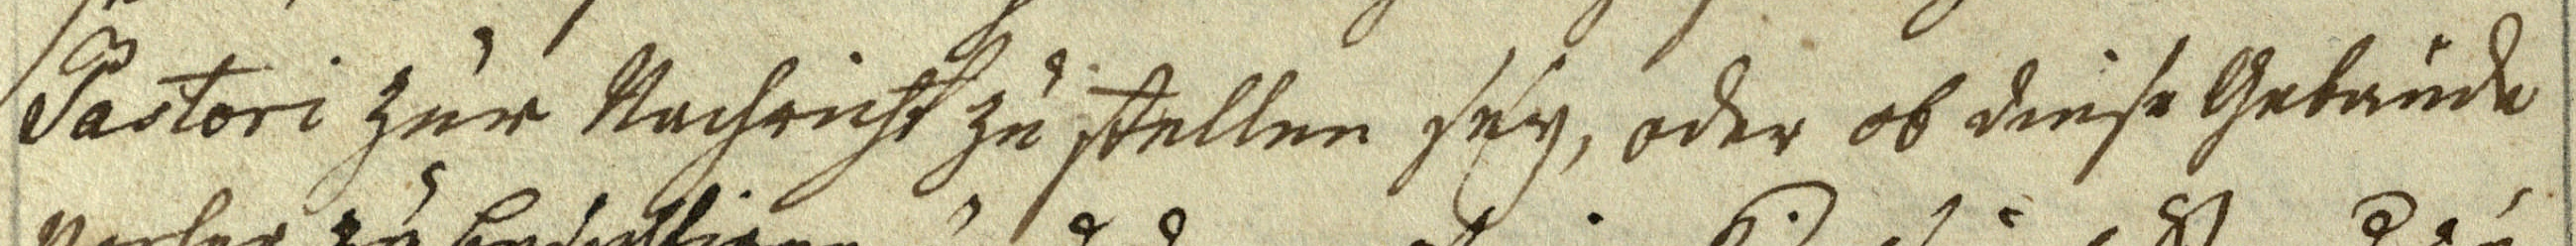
Pastori zur Nachricht zu stellen seÿ, oder ob diese Gebäude
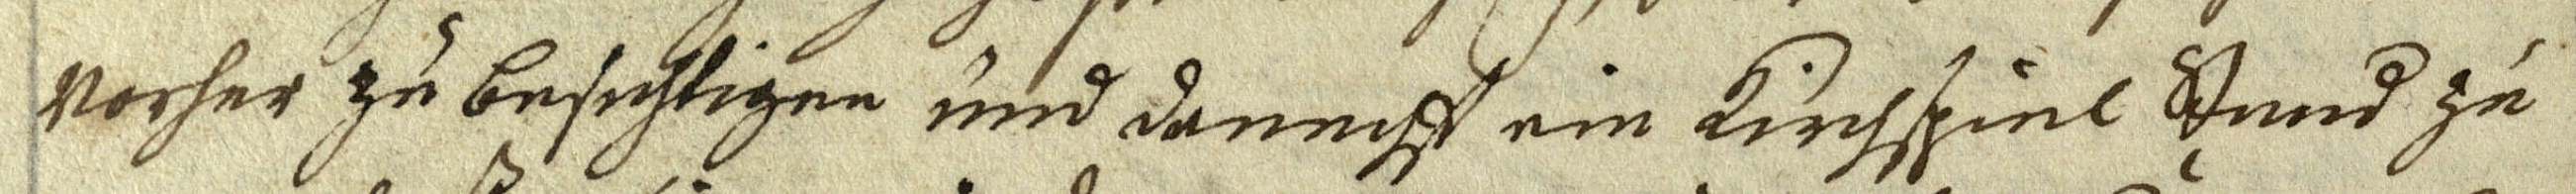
vorher zu besichtigen und danechst ein Kirchspiel Stand zu
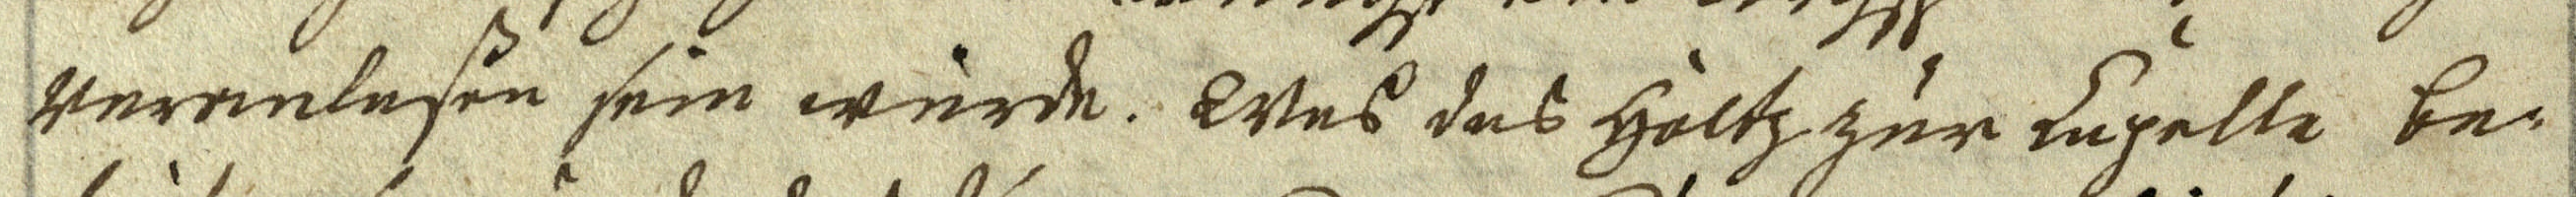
veranlaßen sein würde. Was das Holtz zur Capelle be¬
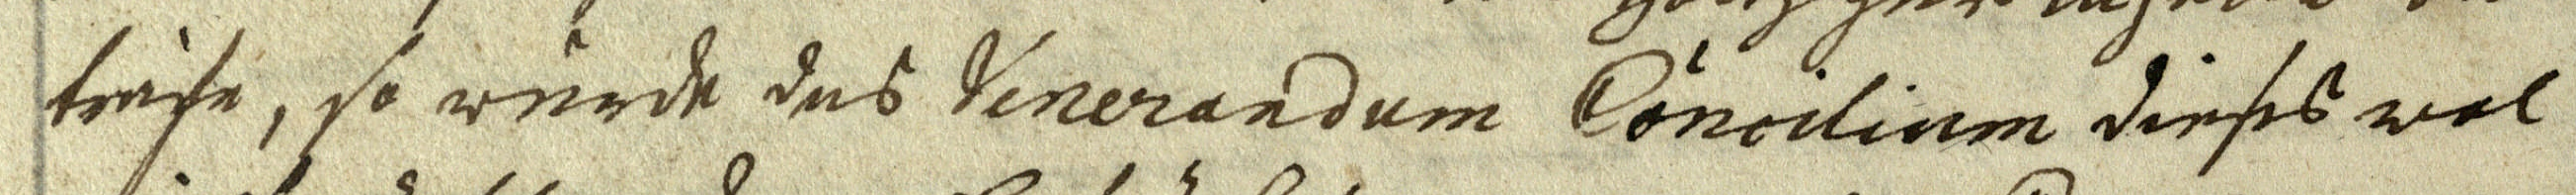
träfe, so würde das Venerandum Concilium dieses wol
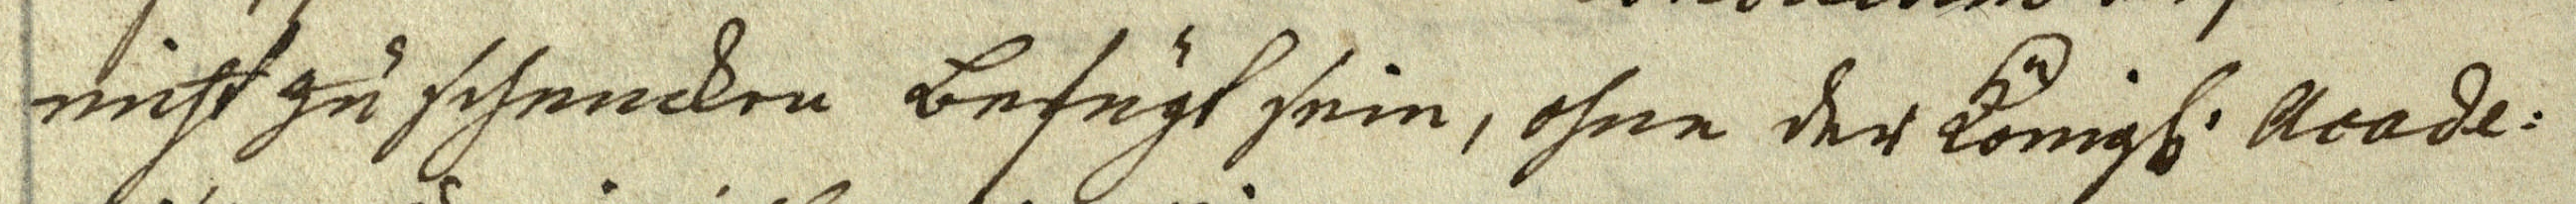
nicht zu schencken befugt sein, ohne der Königl. Acade¬
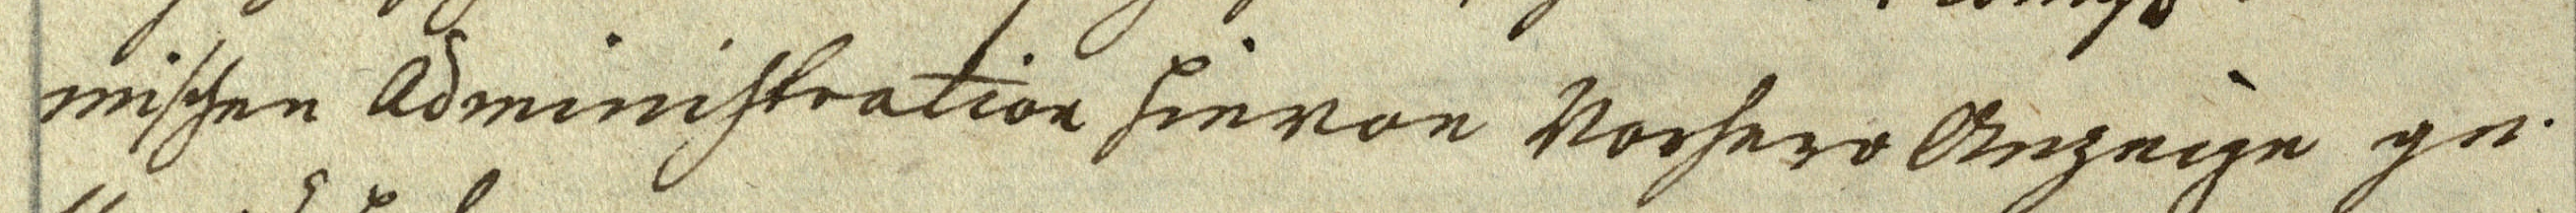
mischen Administration hievon vorhero Anzeige ge¬
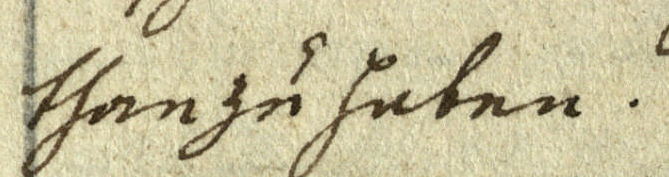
than zu haben.
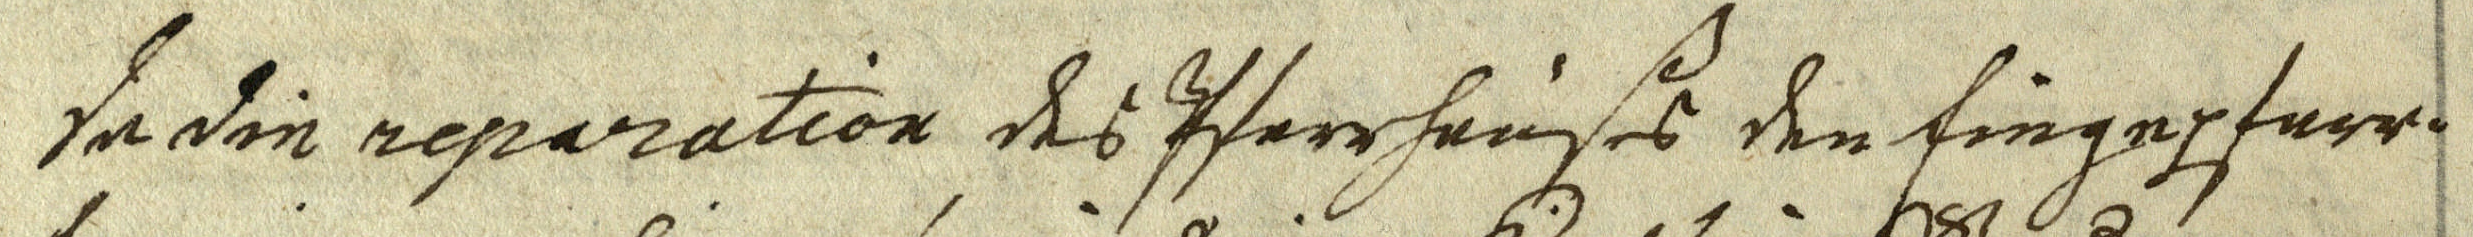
Da die reparation des Pfarrhauses den Eingepfarr¬
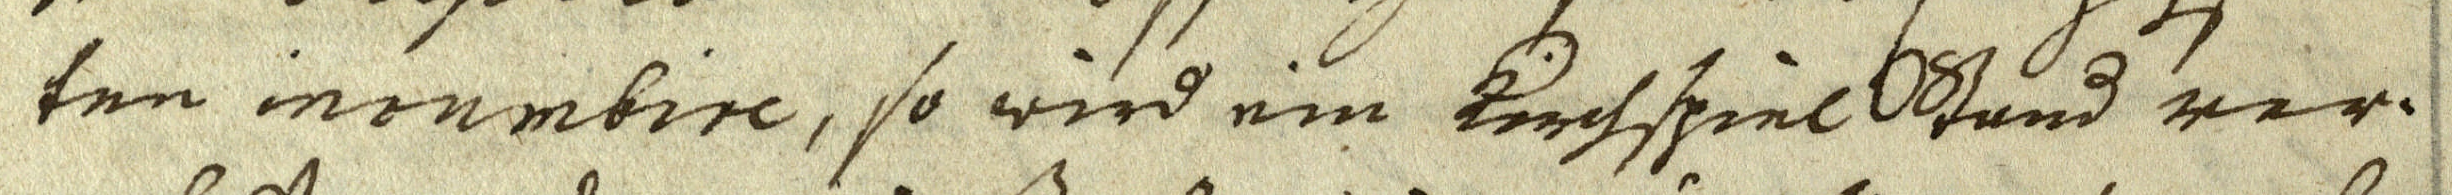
ten incumbire, so wird ein Kirchspiel Stand ver¬
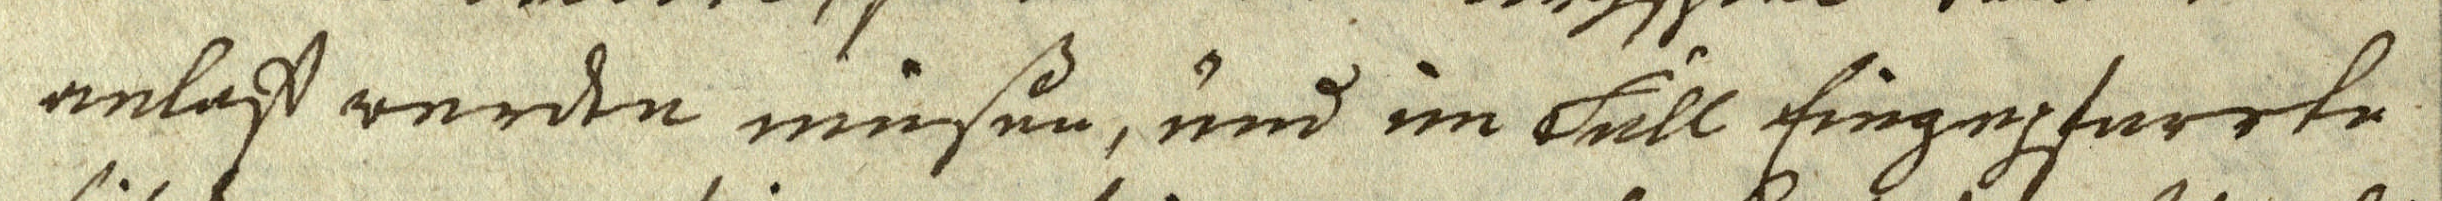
anlast werden müßen, und im Fall Eingepfarrte
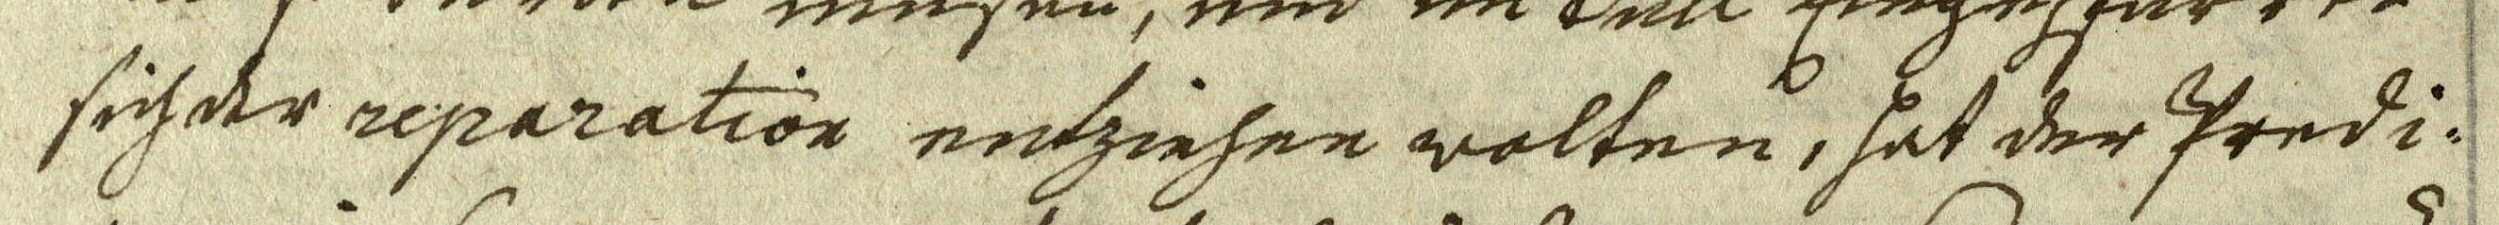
sich der reparation entziehen wolten, hat der Predi¬
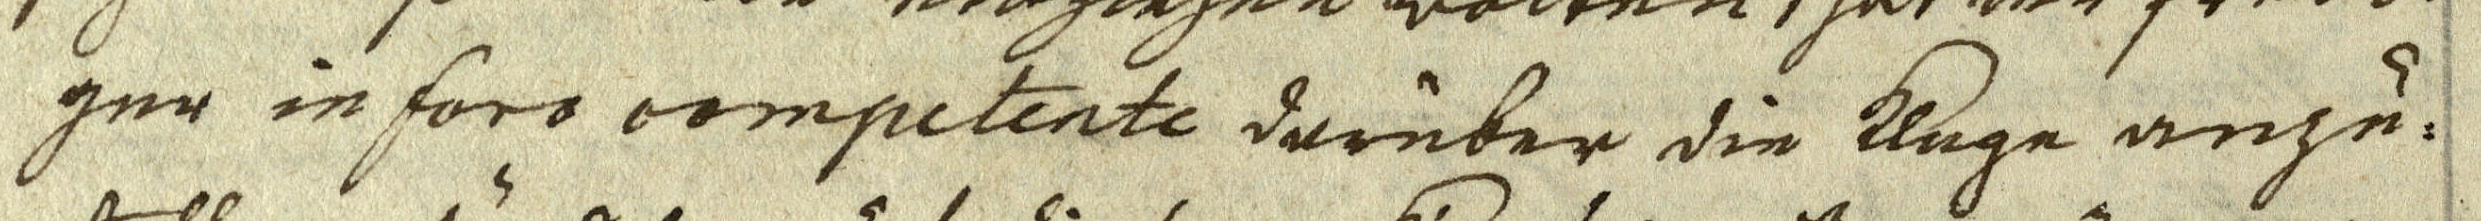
ger in foro competente darüber die Klage anzu¬
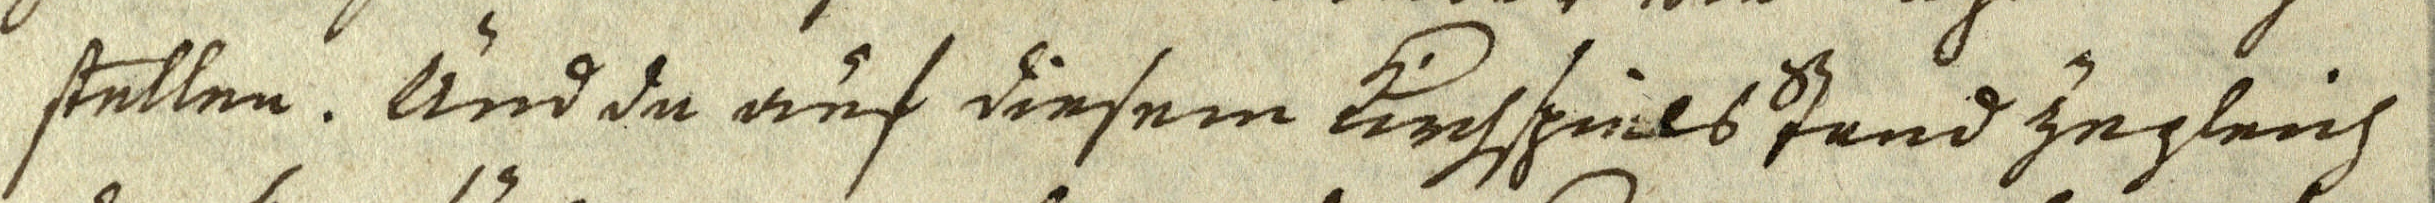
stellen. Und da auf diesem Kirchspiel Stand zugleich
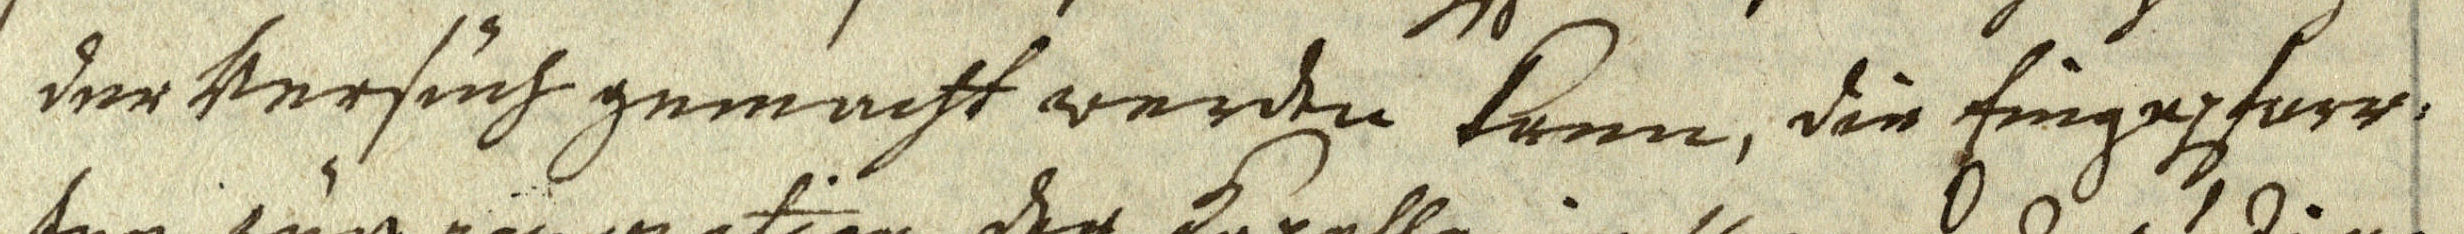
der Versuch gemacht werden kann, die Eingepfarr¬
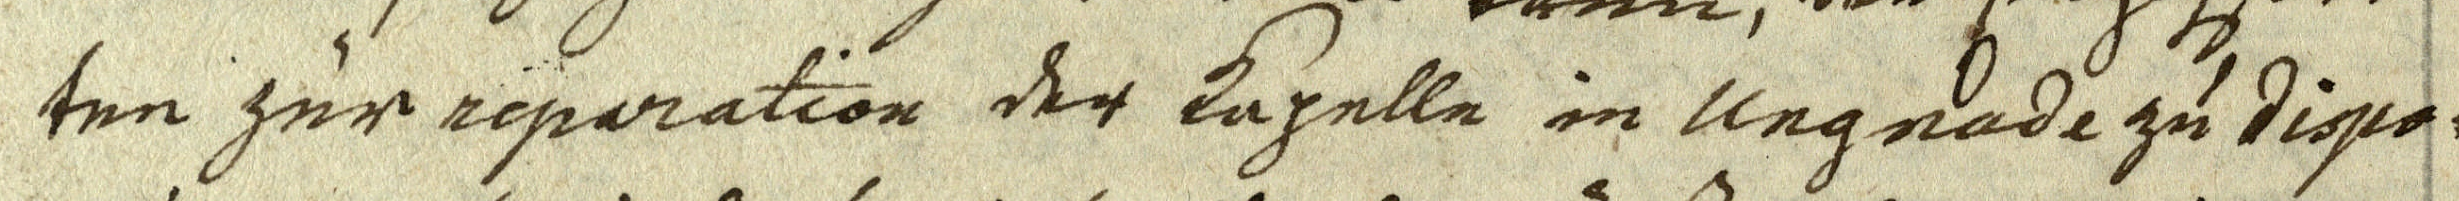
ten zur reparation der Kapelle in Ungnade zu dispo¬
